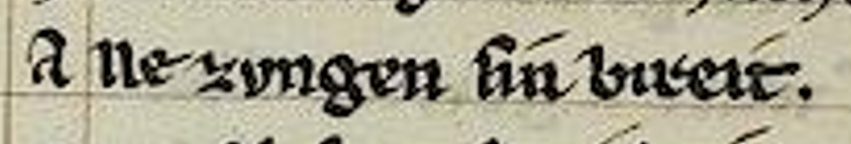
Alle zvngen ſin bireit.
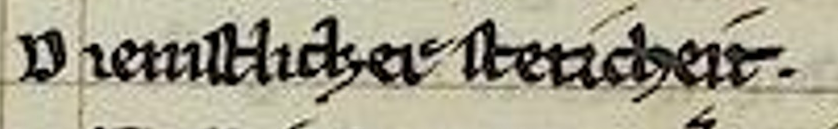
Dienſtlicher ſteticheit.
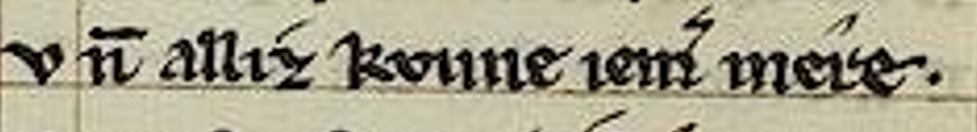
Vn(d) alliz kvnne iem(er) mere.
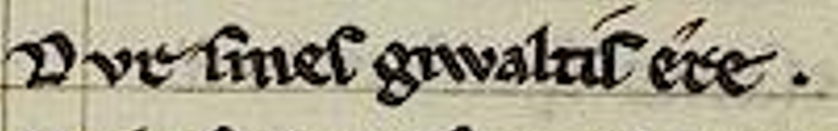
Dvr ſineſ giwaltiſ ere.
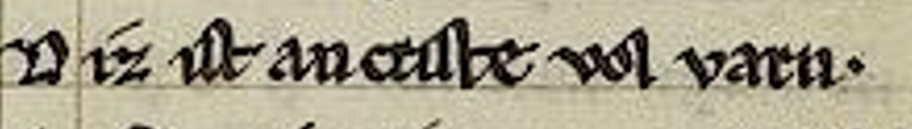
Diz iſt an criſte vol varn.
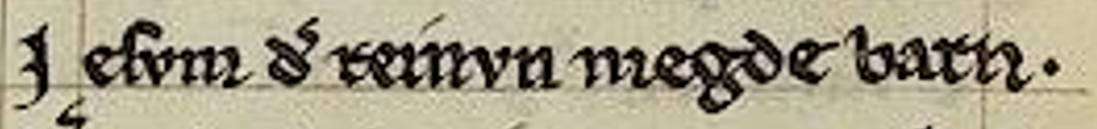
Ieſvm d(er) reinvn magde barn.
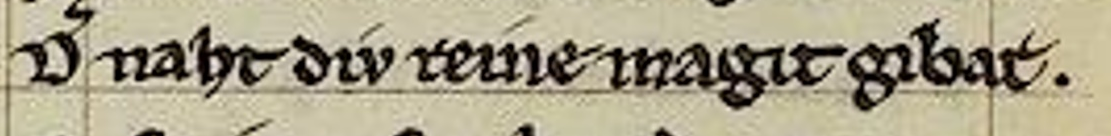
D(er) naht div reine magit gibar.
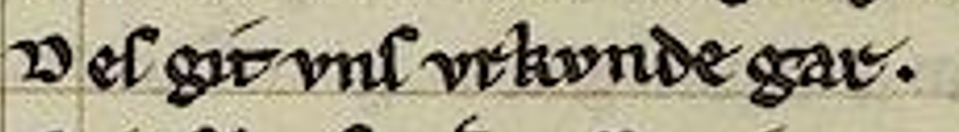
Deſ git vnſ vrkvnde gar.
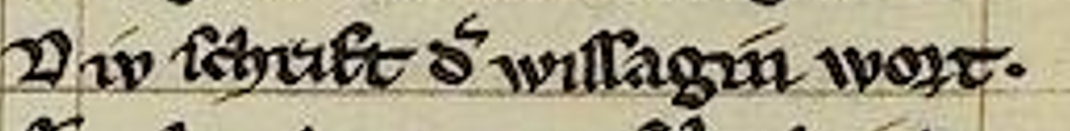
Div ſchrift d(er) wiſſagin wort.
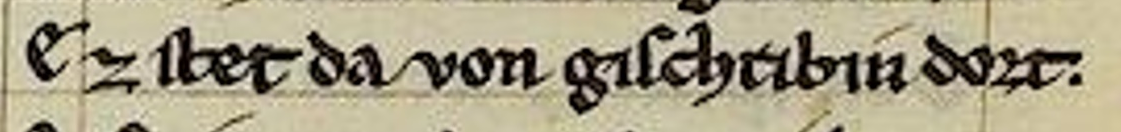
Ez ſtet da von giſchribin dort.
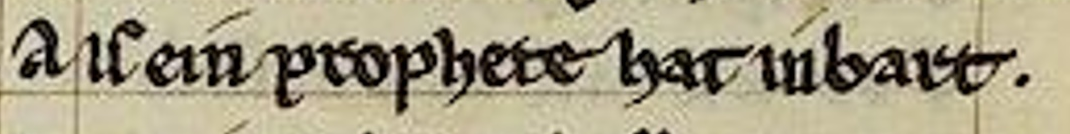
Alſ ein prophete hat inbart.
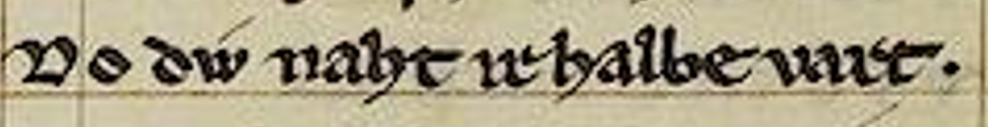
Do div naht ir halbe vart.
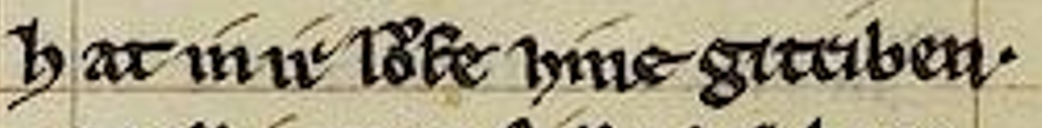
Hat in ir lo°vfe hine gitriben.
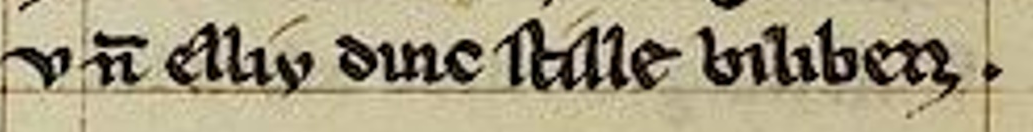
Vn(d) elliv dinc ſtille biliben.
